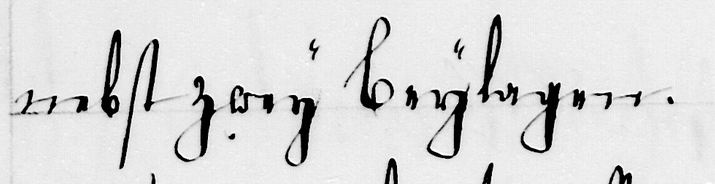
nebst zwey Beylagen.
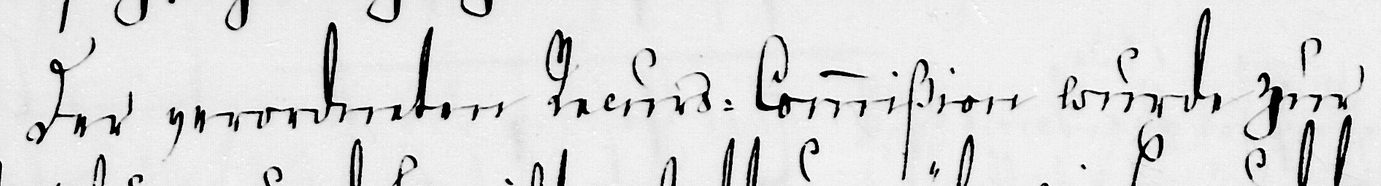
Der verordneten Recurs-Commißion wurde zur
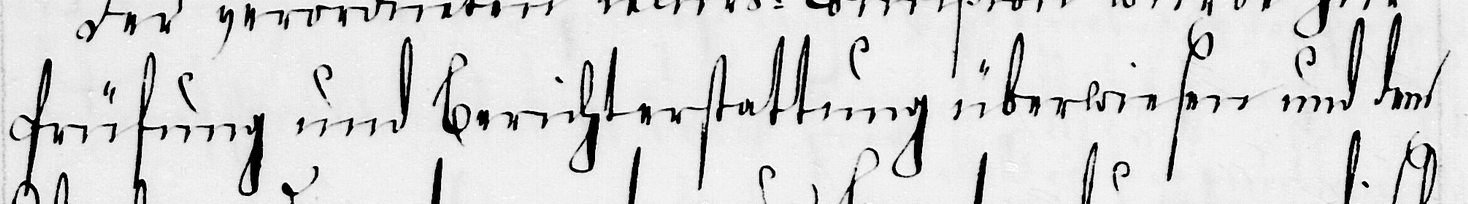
Prüfung und Berichterstattung überwiesen und dem
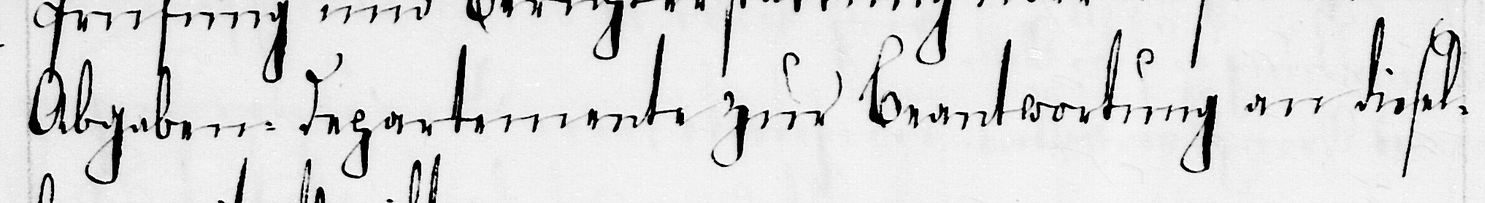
Abgaben-Departemente zur Beantwortung an diesel¬
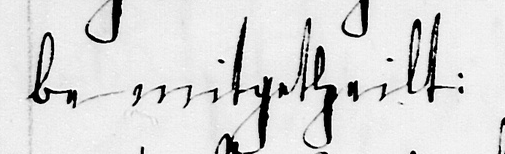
be mitgetheilt:
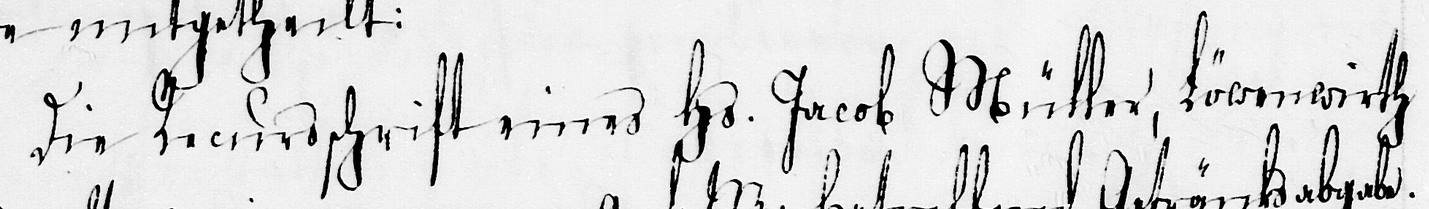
Die Recursschrift eines Hs. Jacob Müller, Löwenwirth
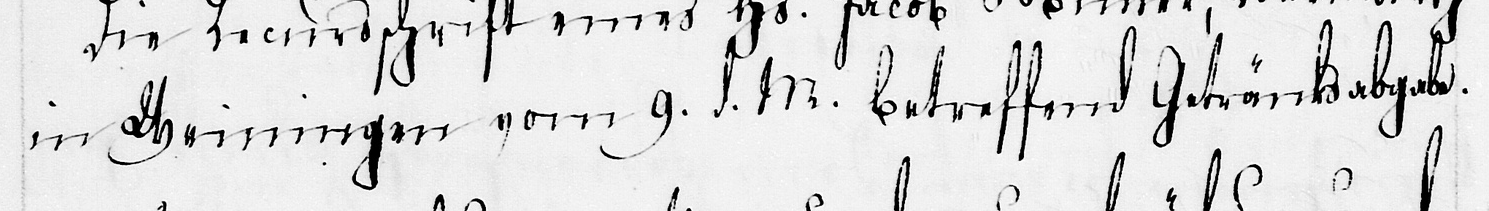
in Weiningen vom 9. d. M. betreffend Getränksabgabe.
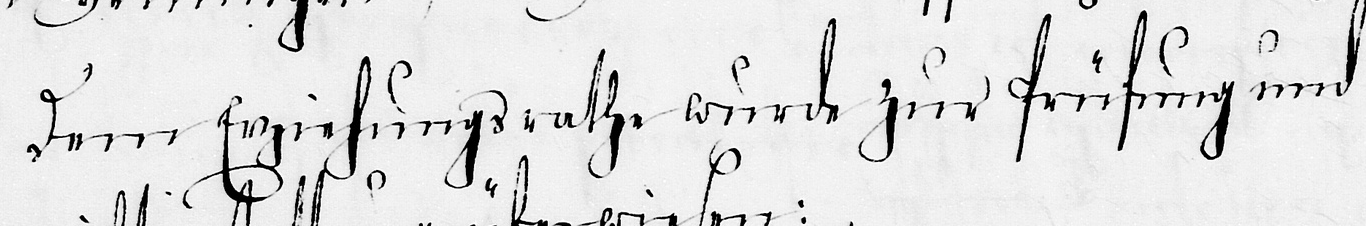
Dem Erziehungsrathe wurde zur Prüfung und
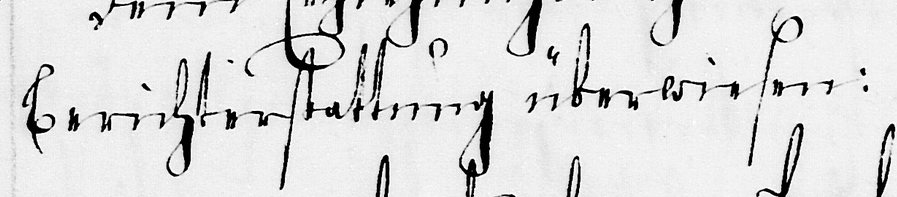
Berichterstattung überwiesen:
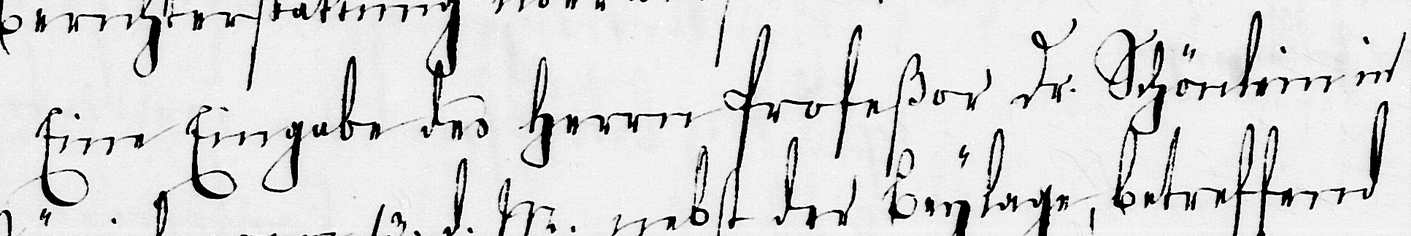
Eine Eingabe des Herrn Profeßor Dr. Schönlein in
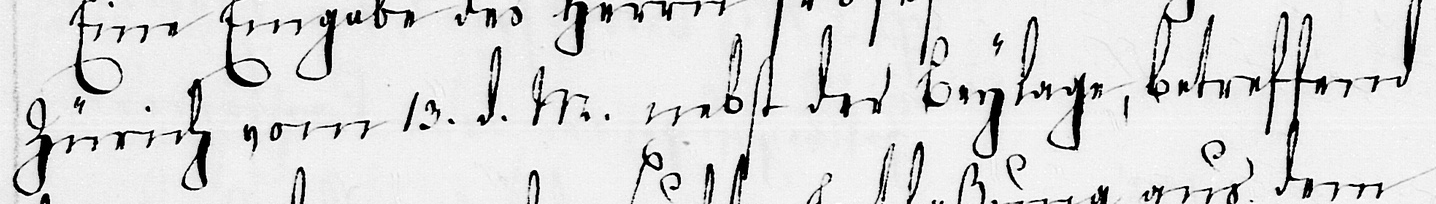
Zürich vom 13. d. M. nebst der Beylage, betreffend
